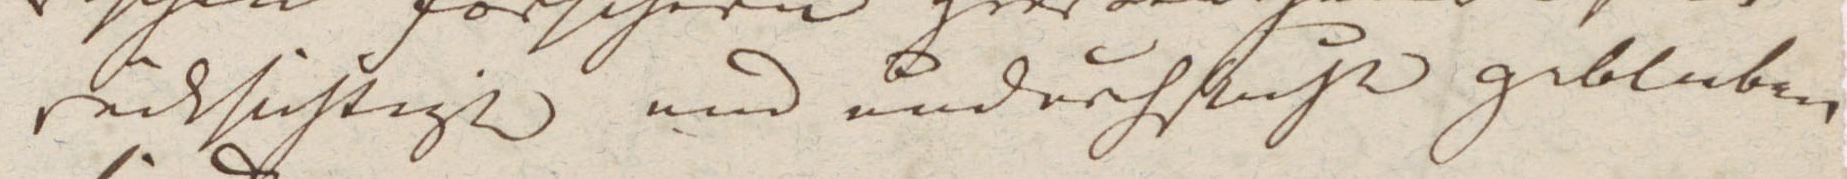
rücksichtigt und undurchsucht geblieben
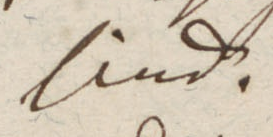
sind. –
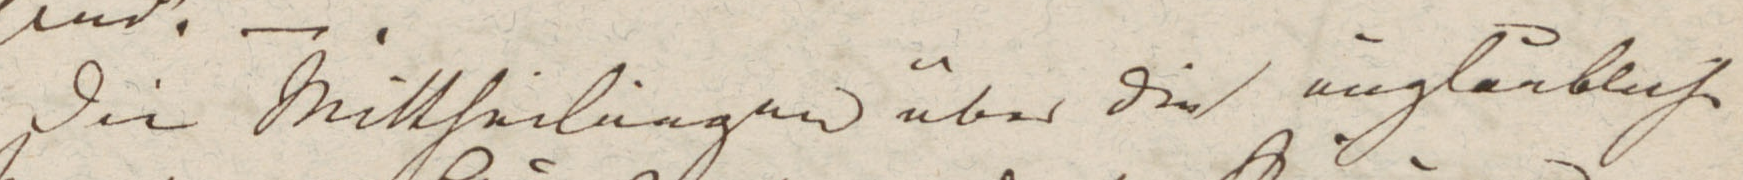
Die Mittheilungen über die unglaubliche
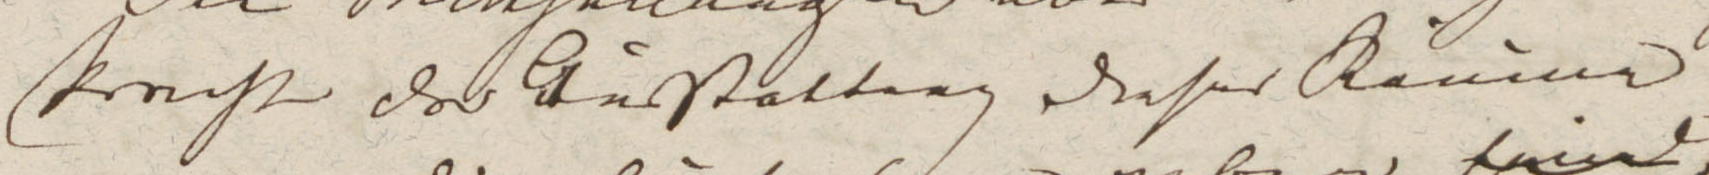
Pracht der aAusstattung dieser Räume
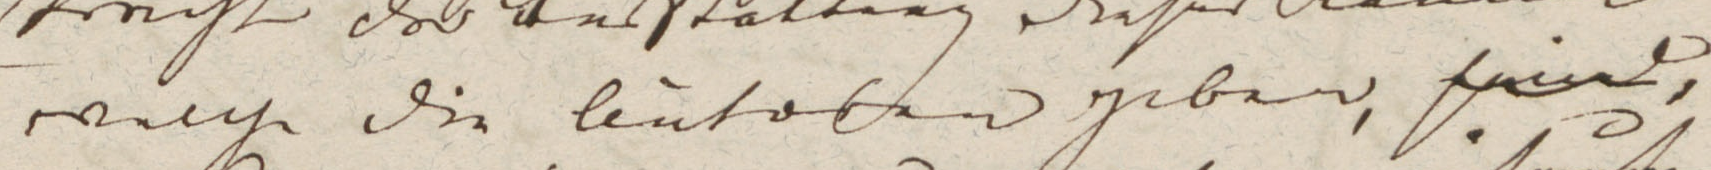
welche die Autoren geben, sind,
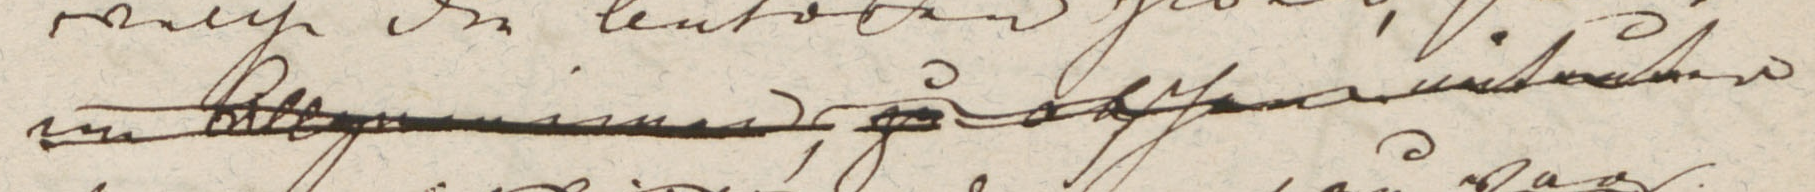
im Allgemeinen, zu obschon mitunter
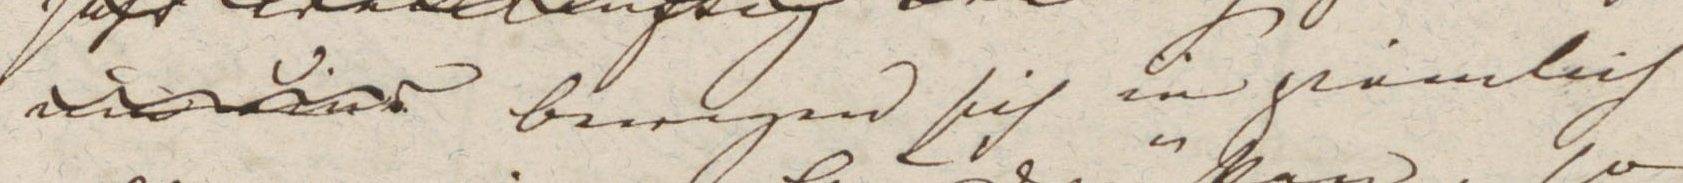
und uns bewegen sich in ziemlich
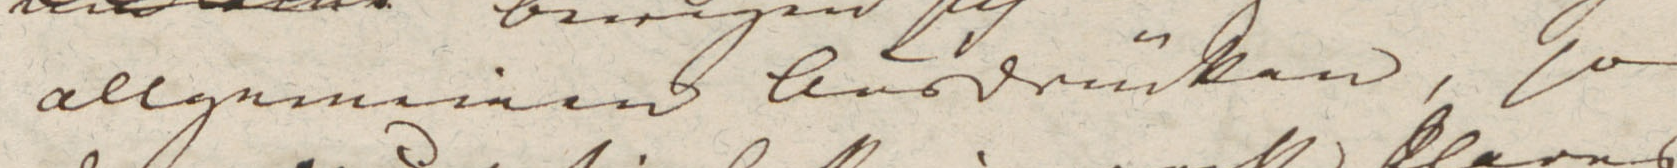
allgemeinen Ausdrücken, so
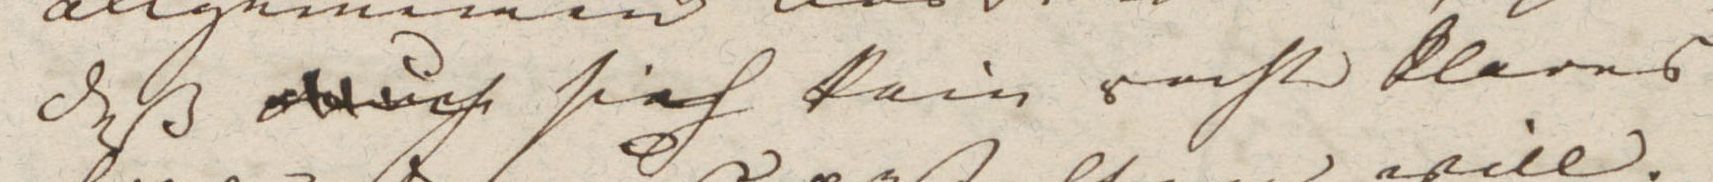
dass durch siech kein recht klares
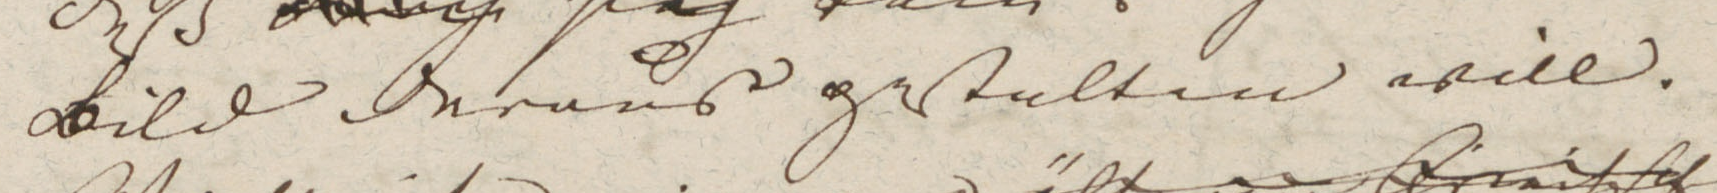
bBild daraus gestalten will.
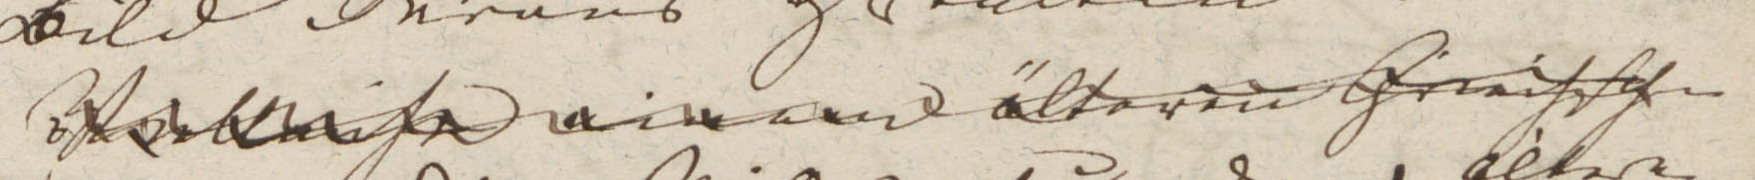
Vielleicht einem älteren Griechischen
